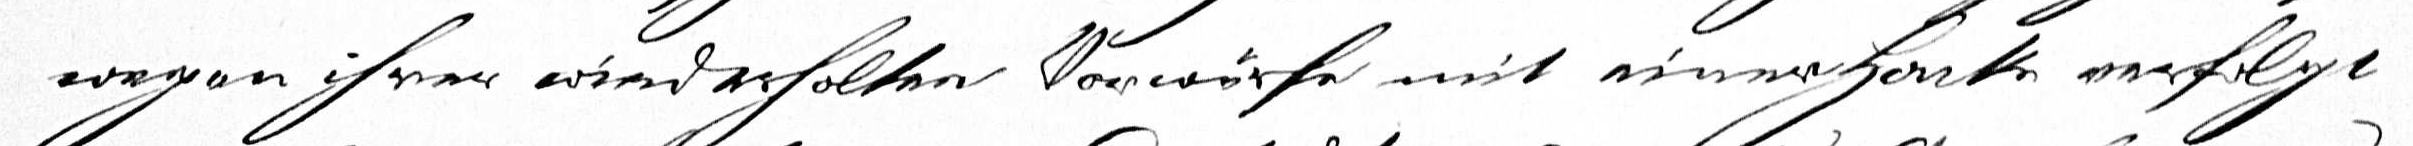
wegen ihrer wiederholten Vorwürfe mit einer Hacke verfolgt
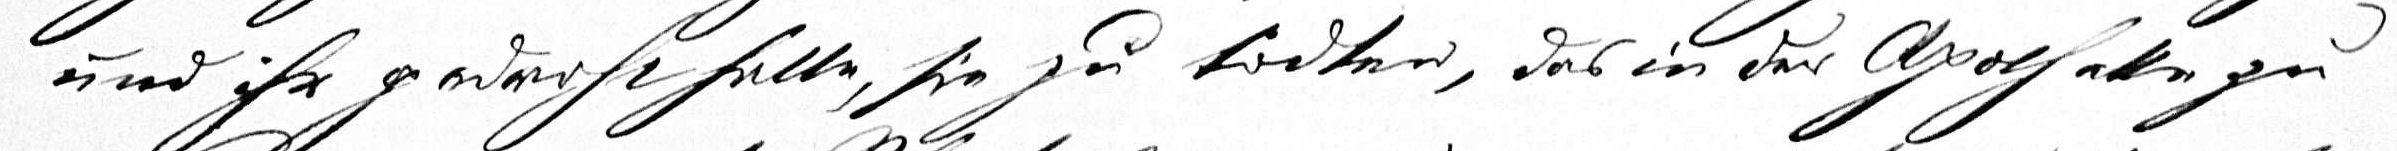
und ihr gedroht hatte, sie zu tödten, das in der Apotheke zu
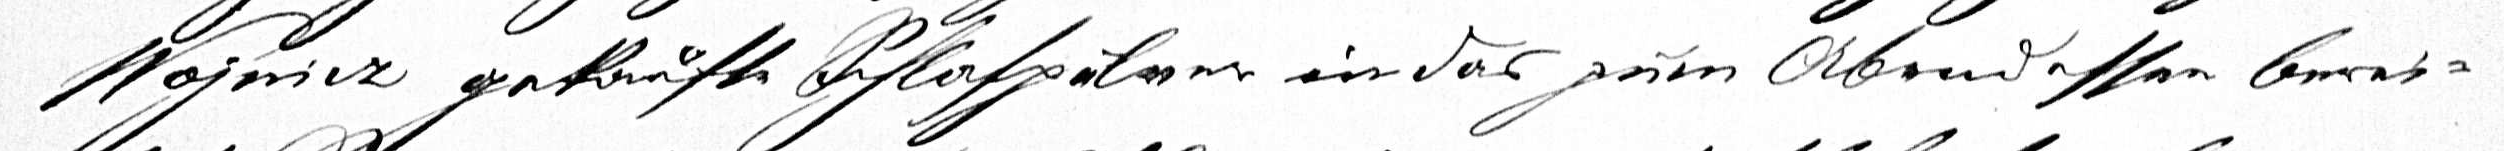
Wojnicz gekaufte Schalfpelen in das zum Abendessen berei¬
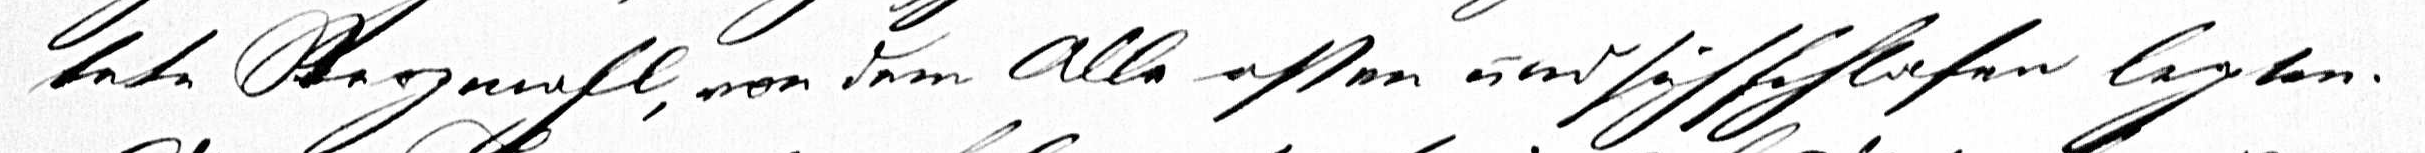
tete Sterzmahl, von dem Alle essen und sich schlafen legten.
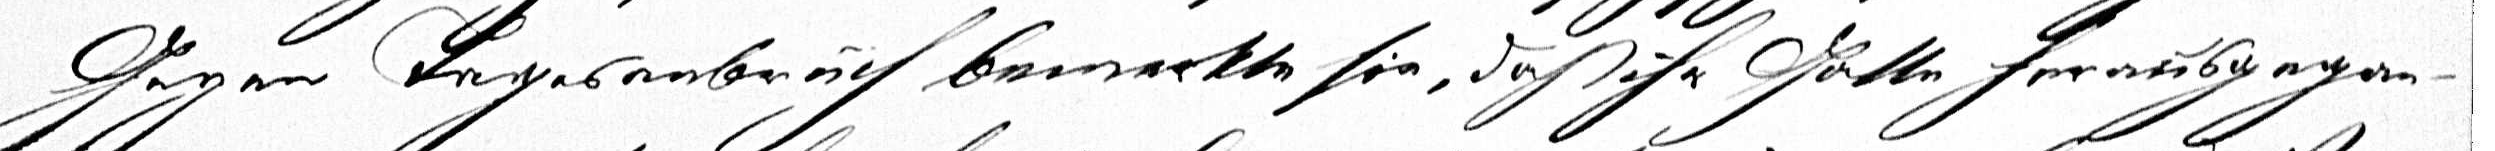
Gegen Tagesanbruch bemerkte sie, daß ihr Gatte herausgegan¬
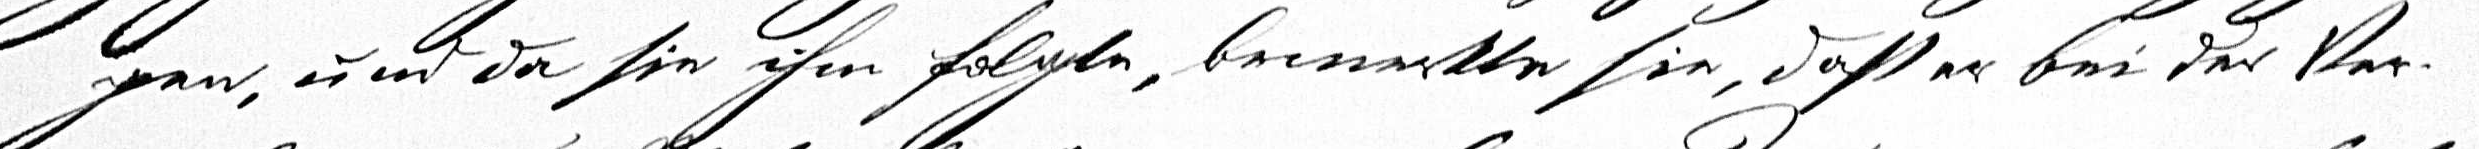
gen, und da sie ihm folgte, bemerkte sie, daß er bei der Ver¬
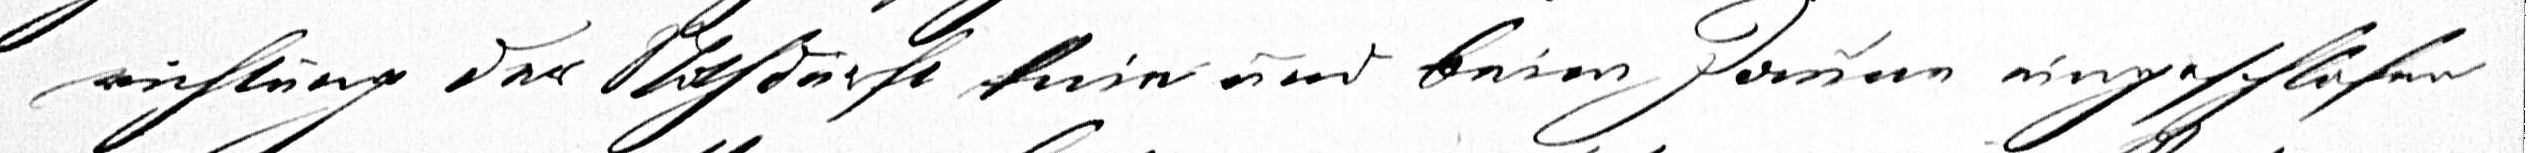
richtung der Nothdurft kein und beim Zaune eingeschlafen
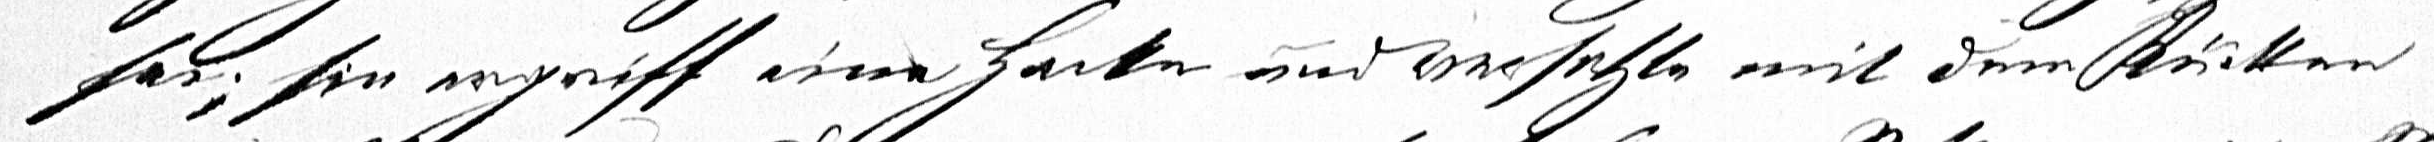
sei; sie ergriff eine Hacke und versetzte mit dem Rücken
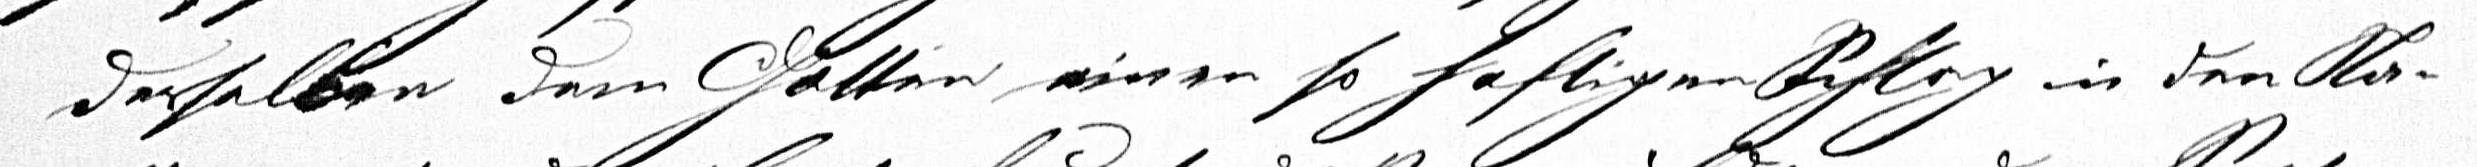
derselben dem Gatten einen so heftigen Schlag in den Na¬
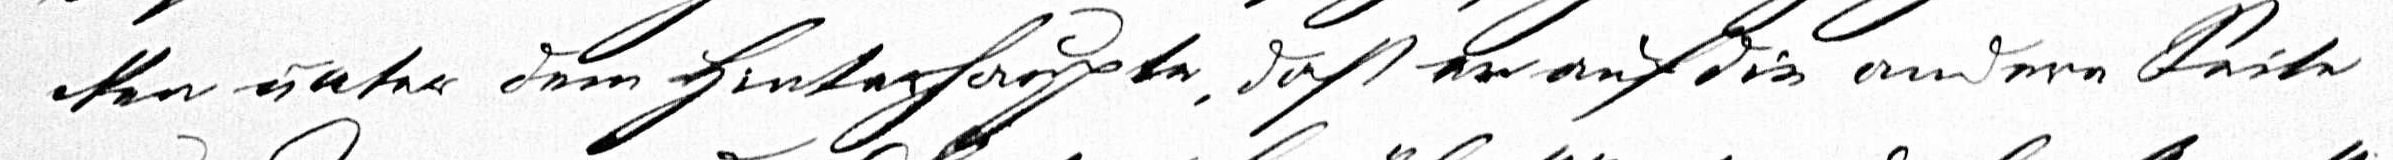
cken unter dem Hinterhaupt, daß er auf die andere Seite
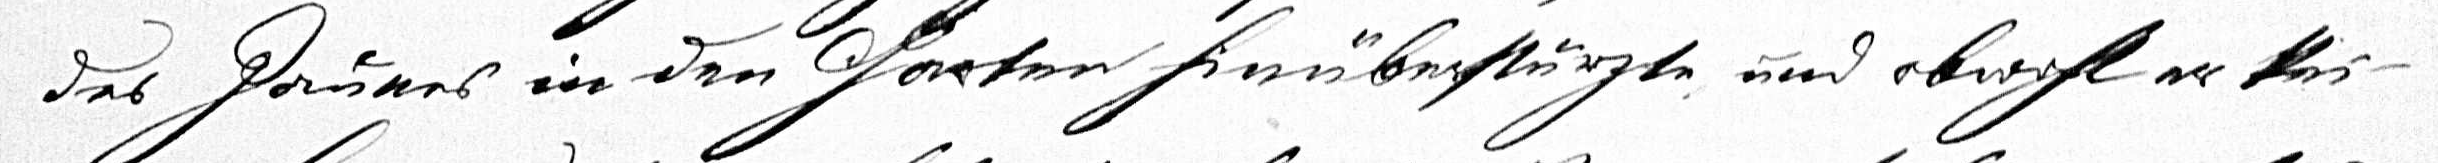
des Zaunes in den Garten hinüberstürzte und obwohl er kei¬
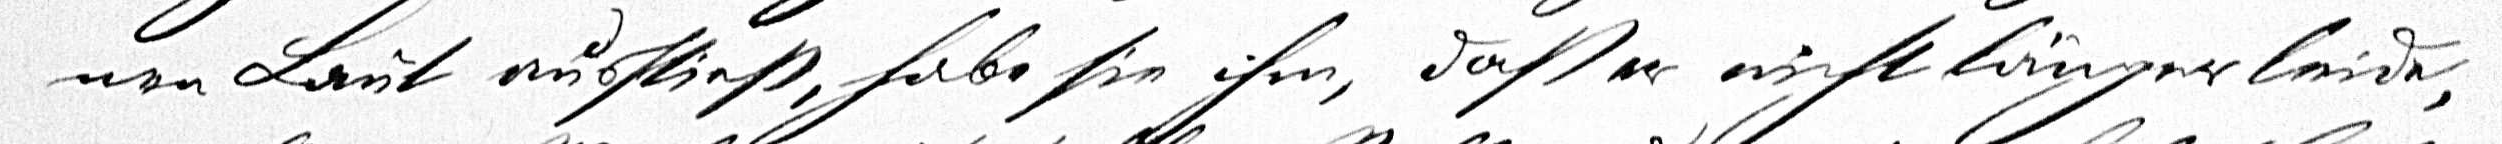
nen Laut ausstieß, habe sie ihm, daß er nicht länger leide
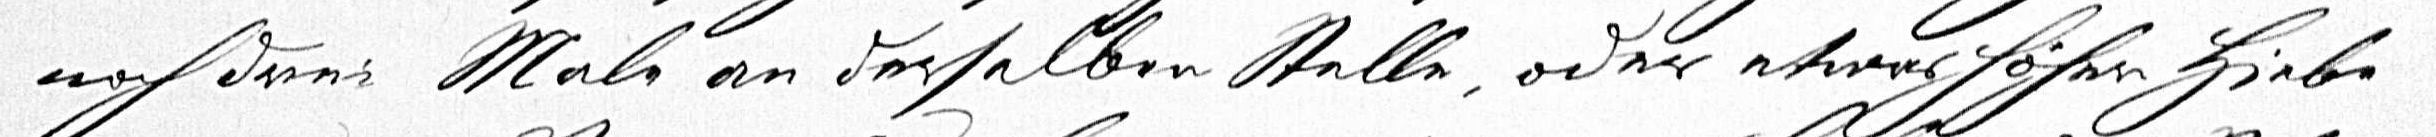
noch drei Male an derselben Stelle, oder etwas höher Hiebe
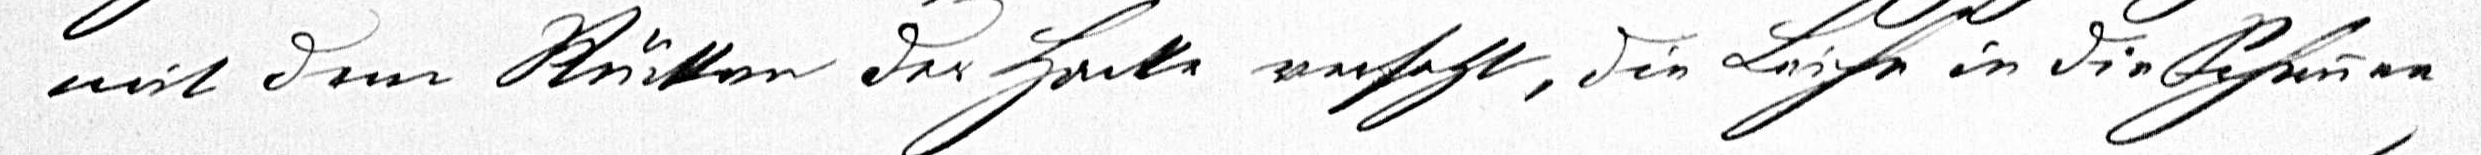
mit dem Rücken der Hacke versetzt, die Leiche in die Scheune
